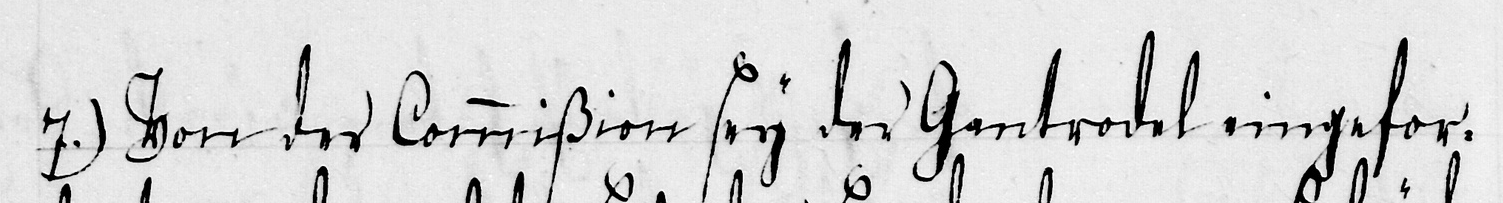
7.) Von der Commißion sey der Gantrodel eingefor¬
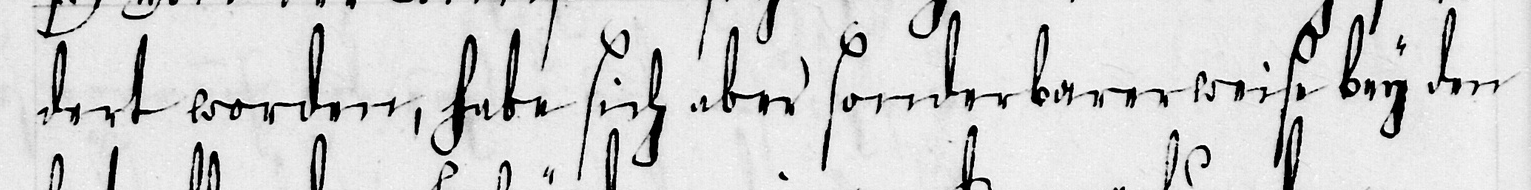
dert worden, habe sich aber sonderbarerweise bey den
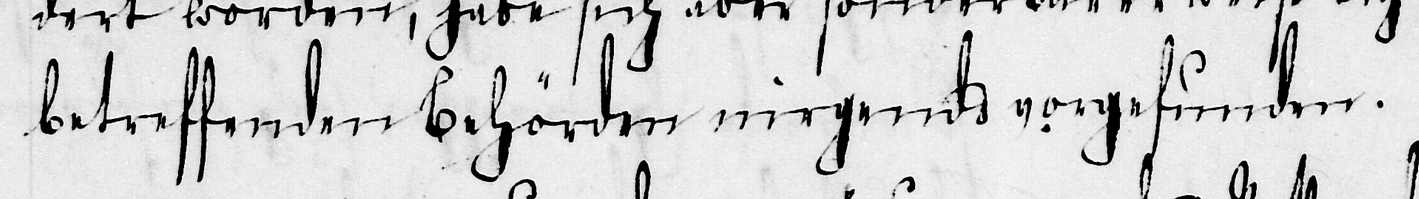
betreffenden Behörden nirgends vorgefunden.
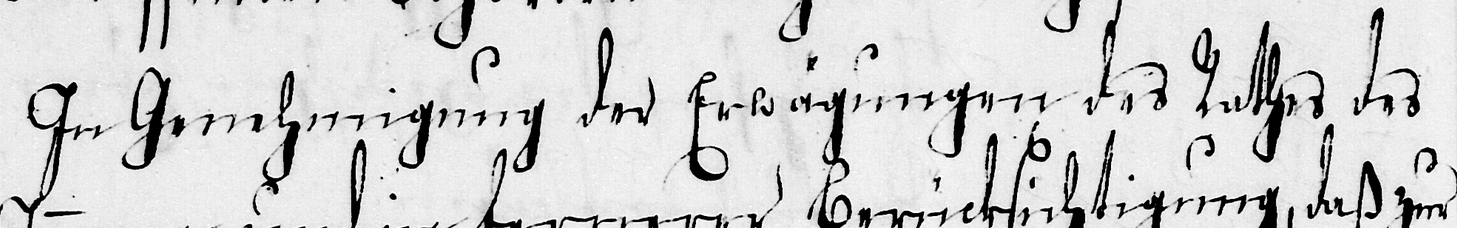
In Genehmigung der Erwägungen des Rathes des
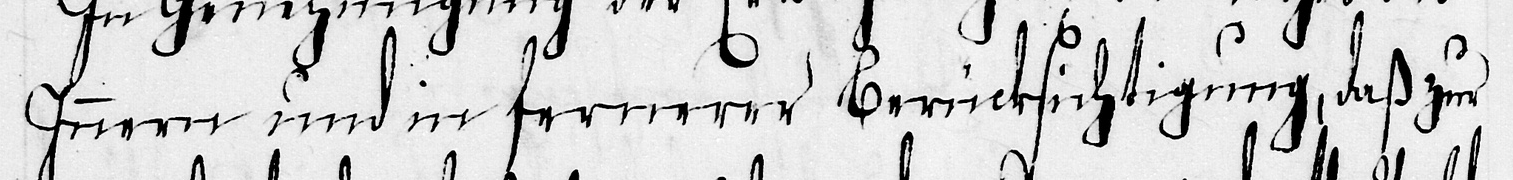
Innern und in fernerer Berücksichtigung, daß zur
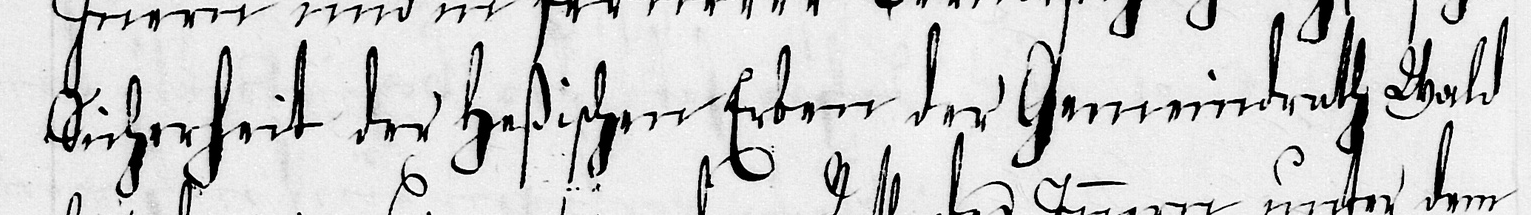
Sicherheit der Heßischen Erben der Gemeindrath Wald
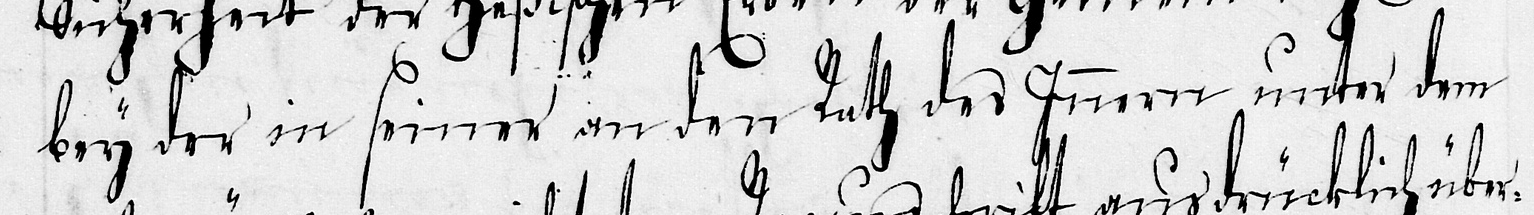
bey der in seiner an den Rath des Innern unter dem
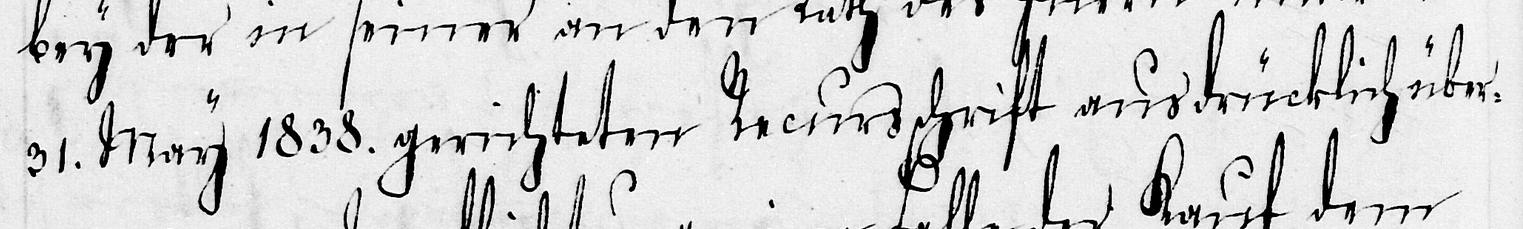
31. May 1838. gerichteten Recursschrift ausdrücklich übe¬
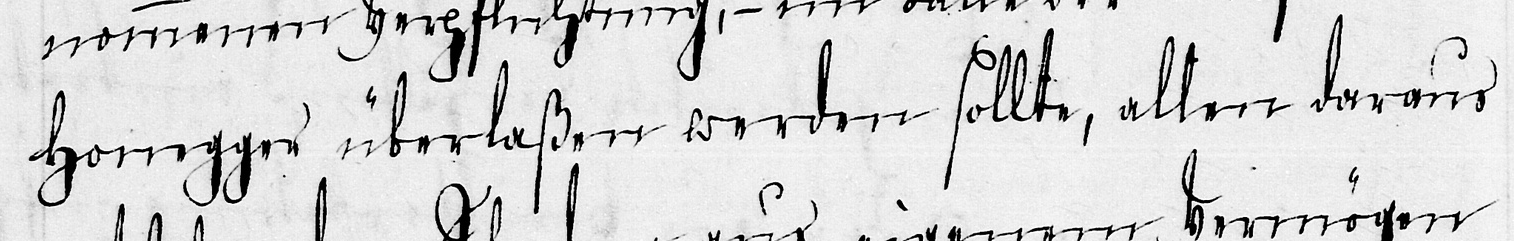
Honegger überlaßen werden sollte, allen daraus
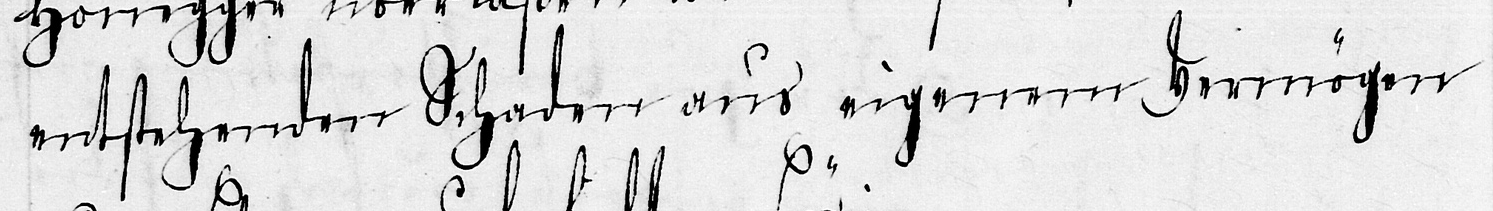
entstehenden Schaden aus eigenem Vermögen
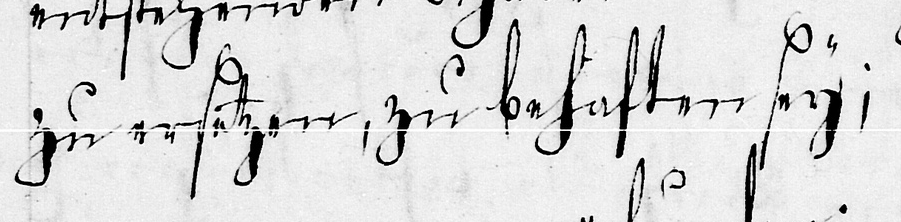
zu ersetzen, zu behaften sey;
